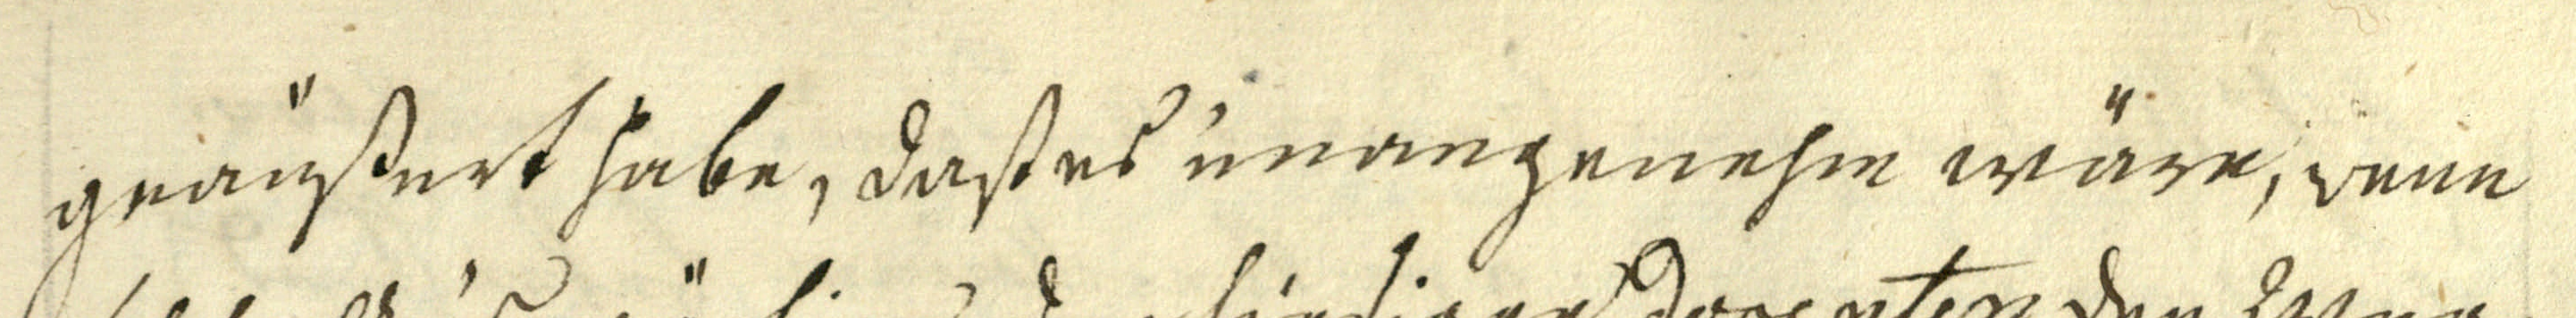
geäußert habe, daß es unangenehm wäre, wenn
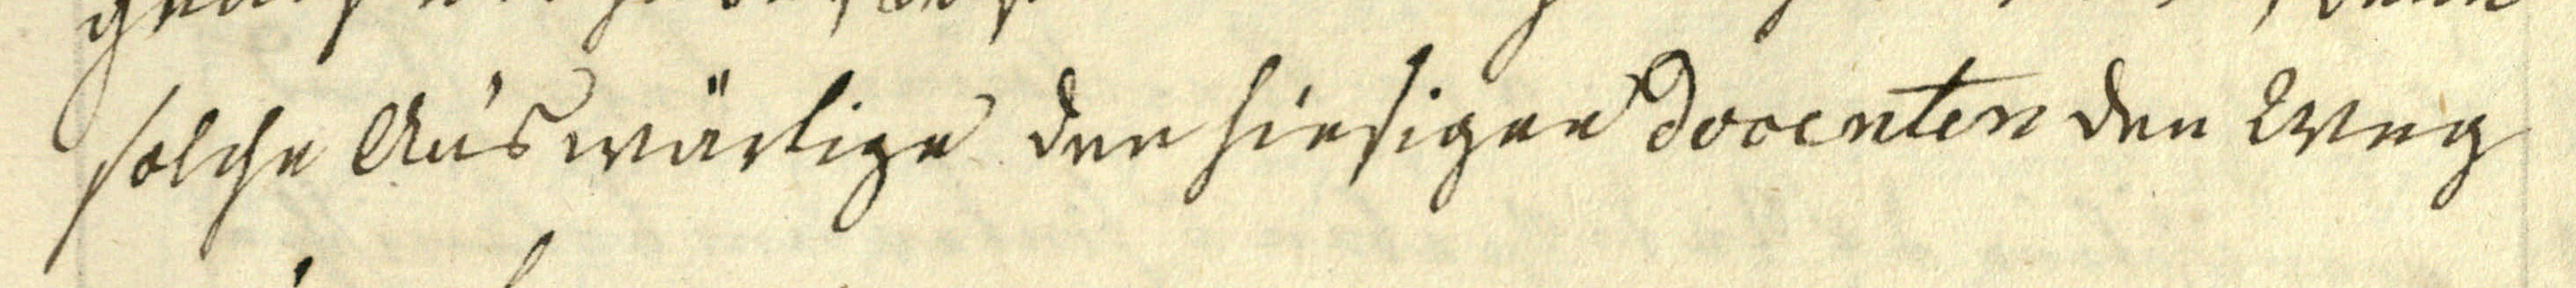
solche Auswärtige den hiesigen Docenten den Weg
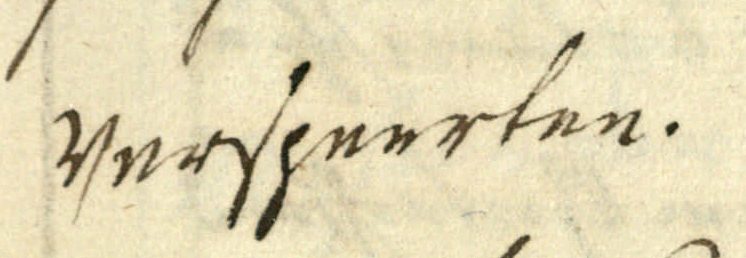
versperrten.
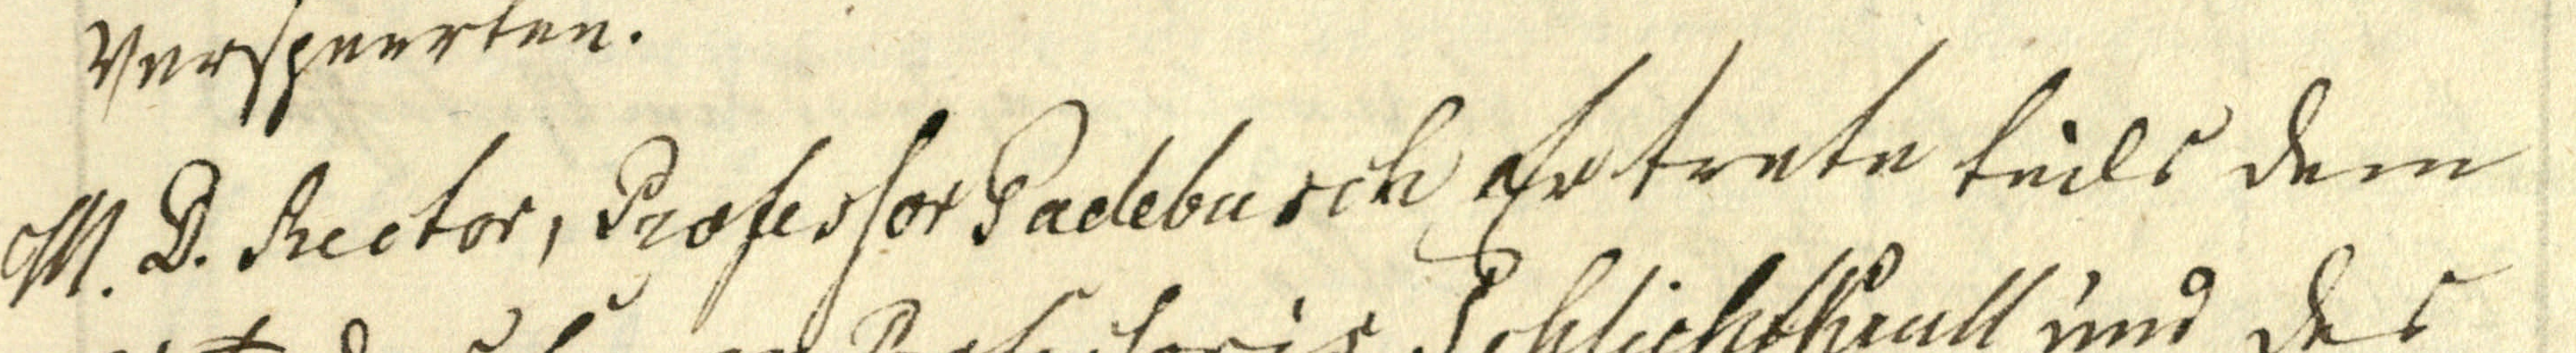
M. D. Rector, Professor Gadebusch Er trete teils dem
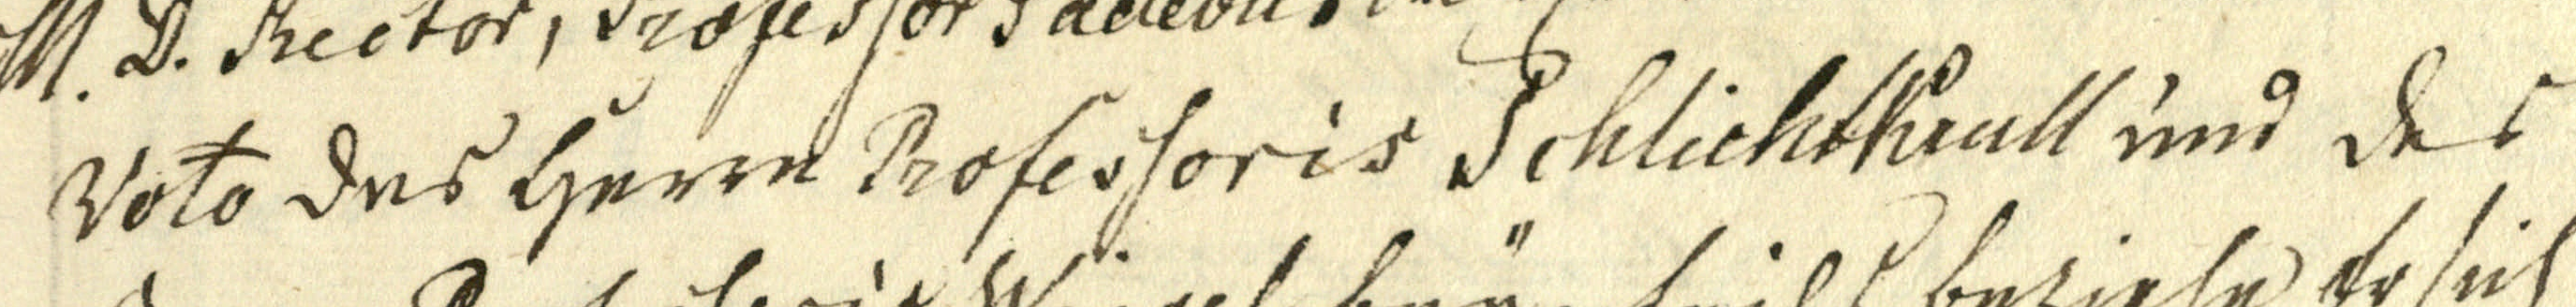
Voto das Herrn Professoris Schlichtkrull und des
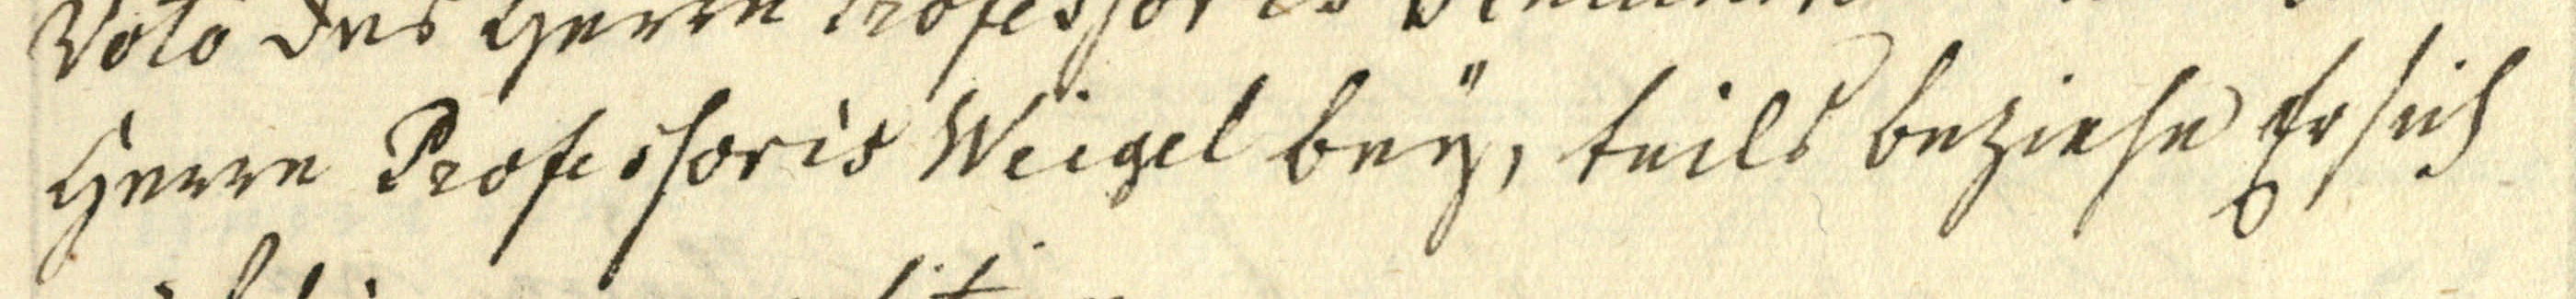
Herrn Professoris Weigel beÿ, teils beziehe Er sich
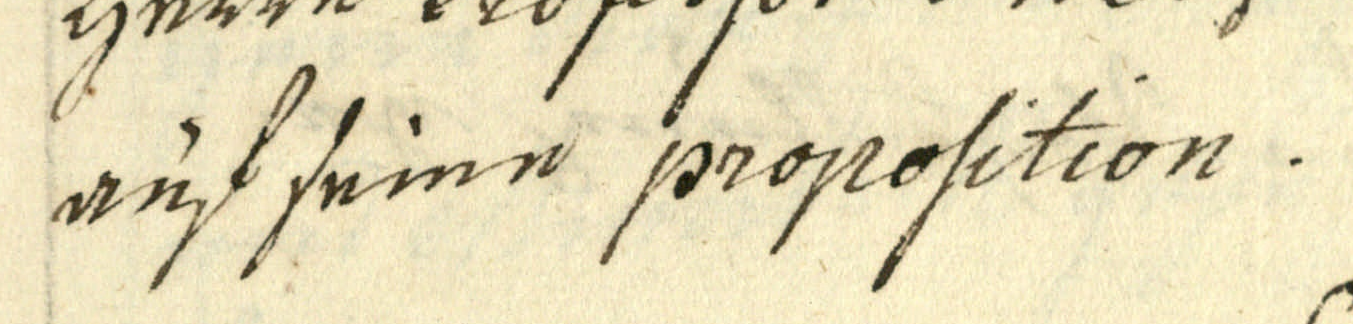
auf seine proposition.
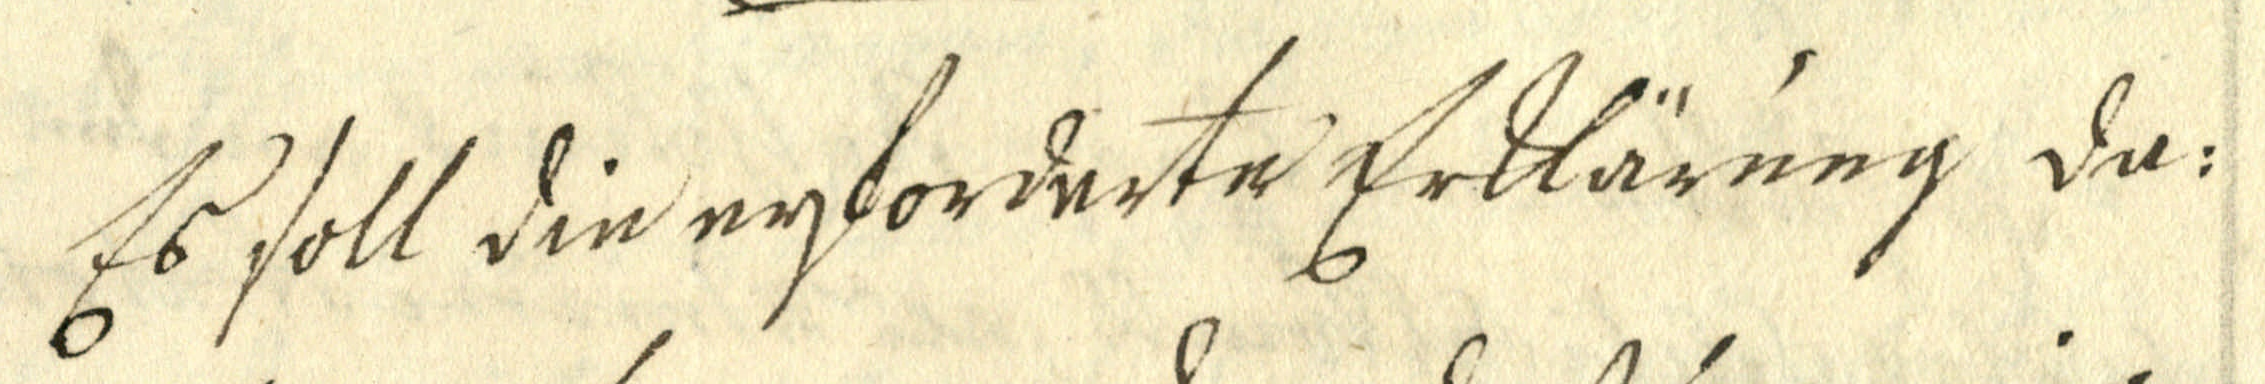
Es soll die erforderte Erklärung da¬
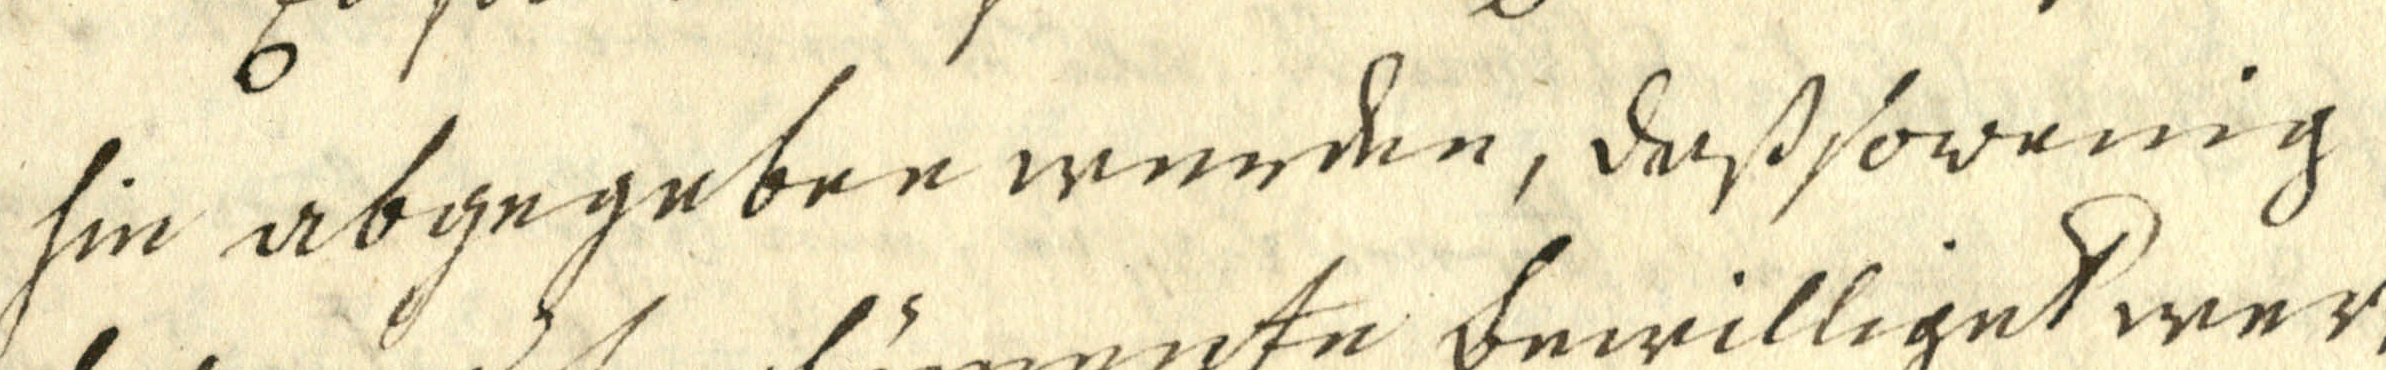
hin abgegeben werden, daß sowenig
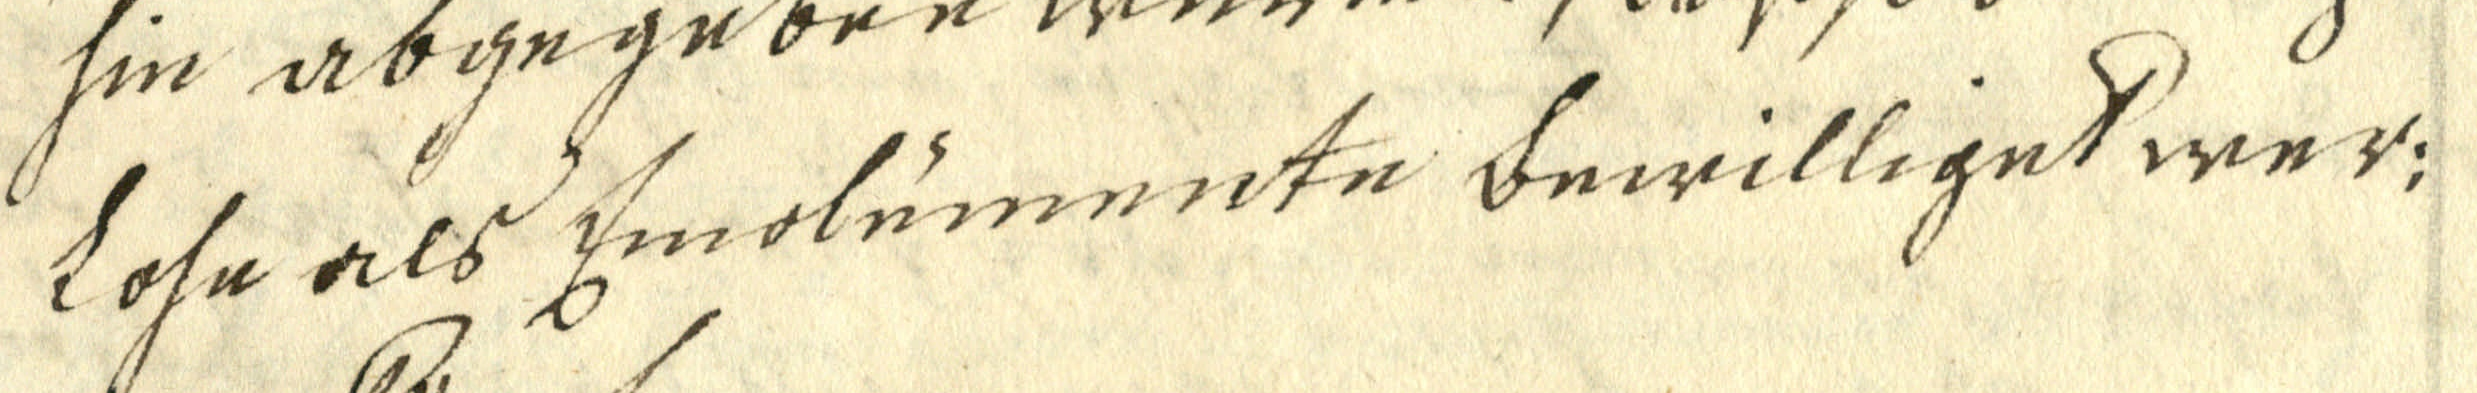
Lohn als Emolumente bewilliget wer¬
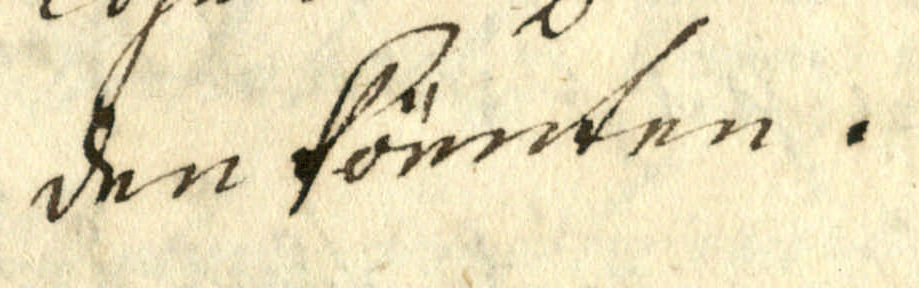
den könnten.
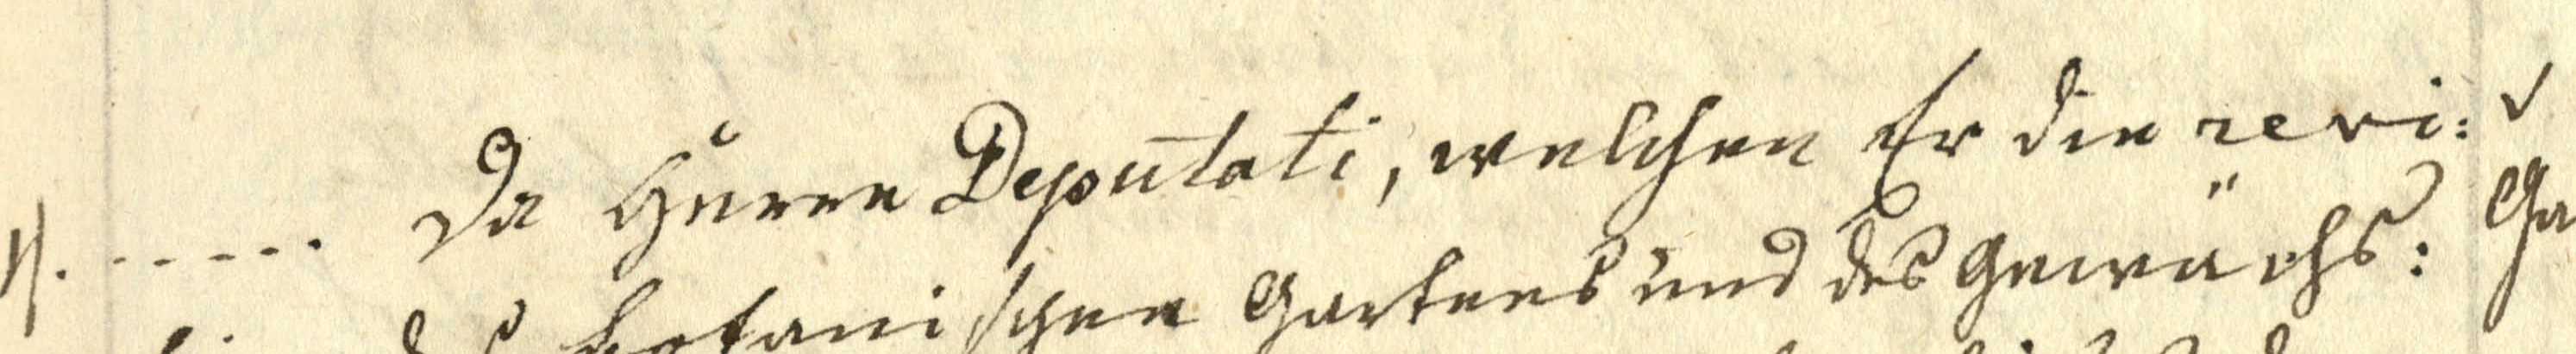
4. Da Herrn Deputati, welchen Er die revi¬
